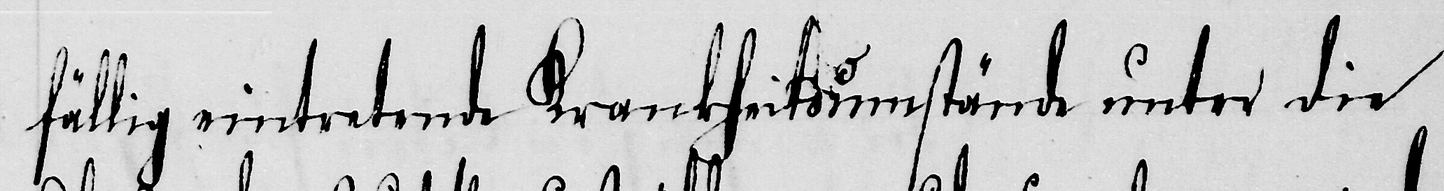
fällig eintretende Krankheitsumstände unter die
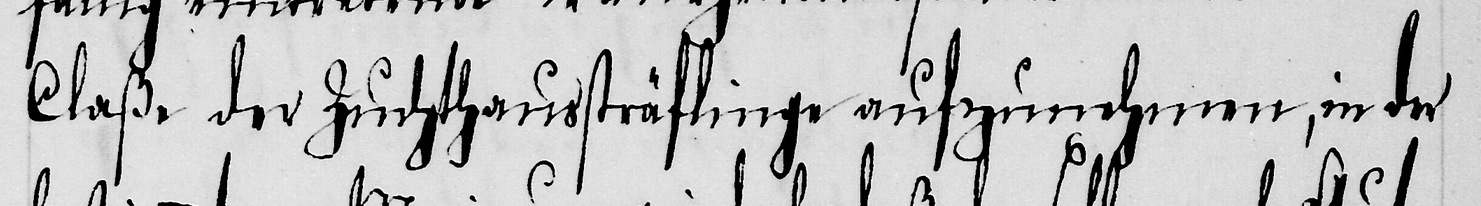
Claße der Zuchthaussträflinge aufzunehmen, in der
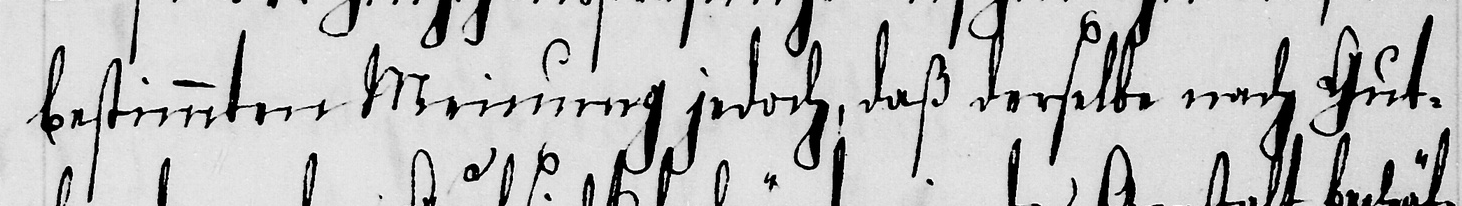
bestimmten Meinung jedoch, daß derselbe nach Gut¬
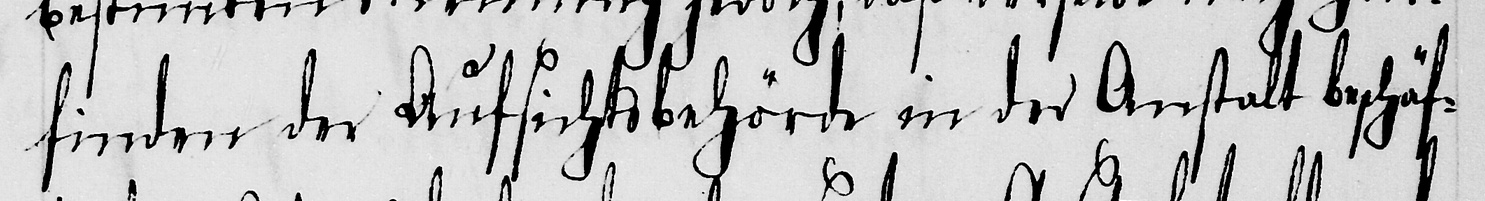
finden der Aufsichtsbehörde in der Anstalt beschäf¬
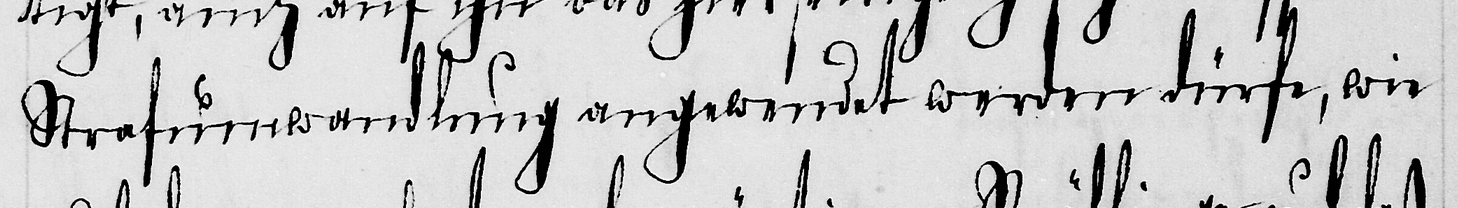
Strafumwandlung angewendet werden dürfe, wie
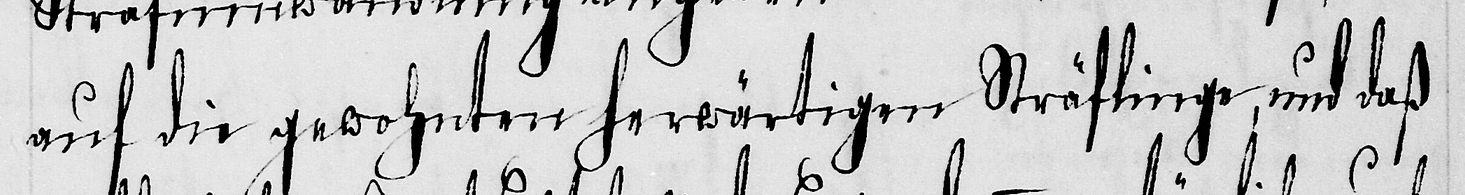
auf die gewohnten herwärtigen Sträflinge, und daß
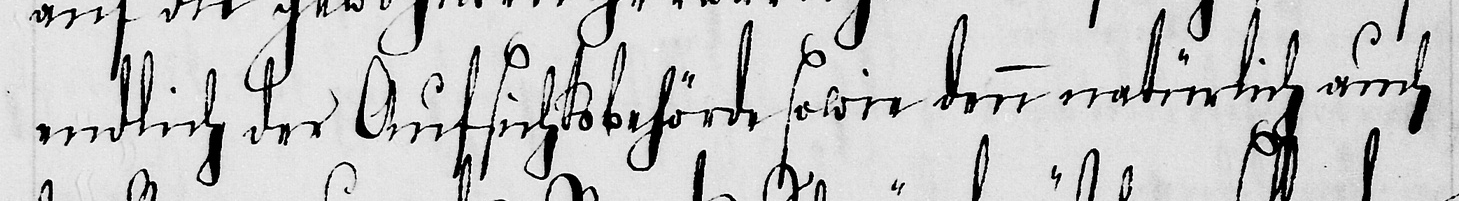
endlich der Aufsichtsbehörde sowie denn natürlich auch
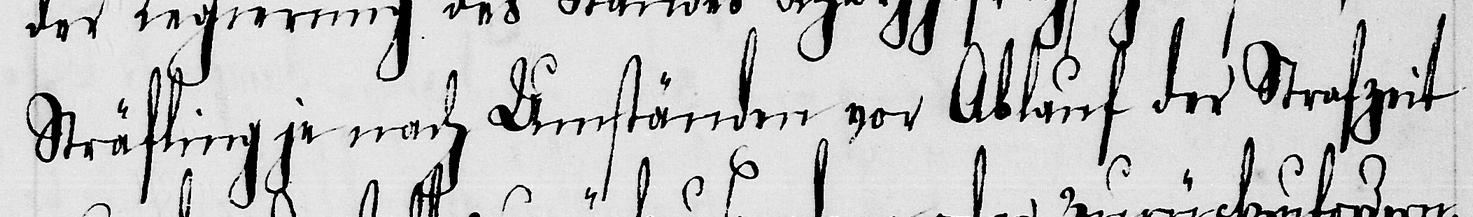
Sträfling je nach Umständen vor Ablauf der Strafzeit
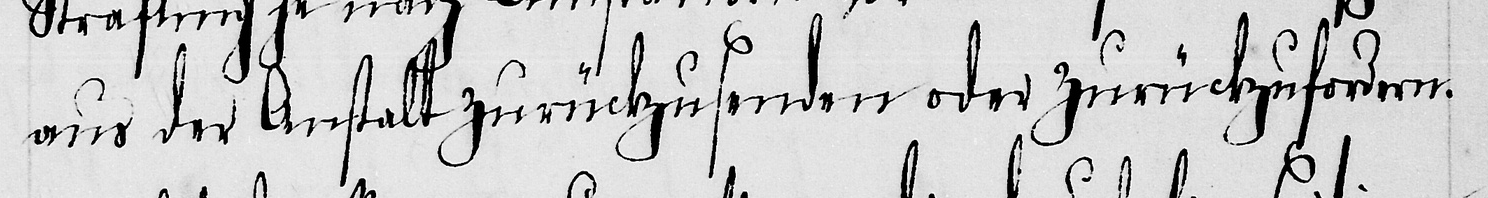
aus der Anstalt zurückzusenden oder zurückzufordern.
